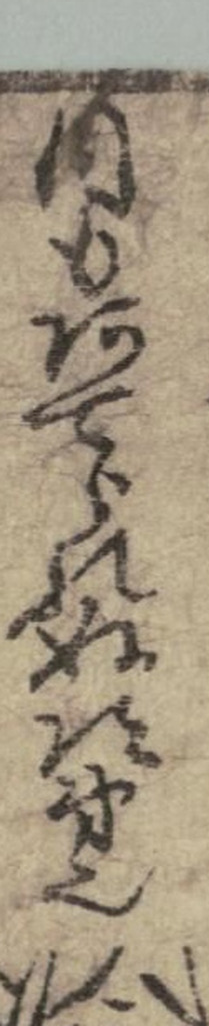目もあてられぬ次第也
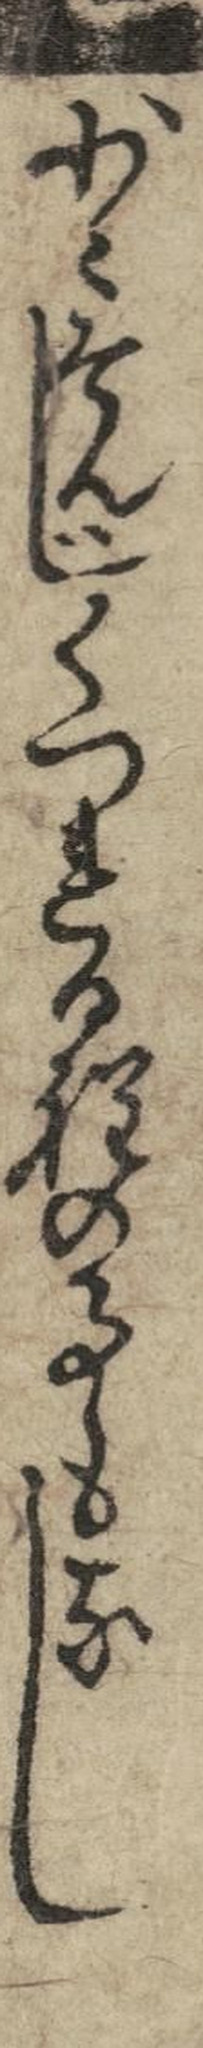そんじくつれる伺どの事もなし
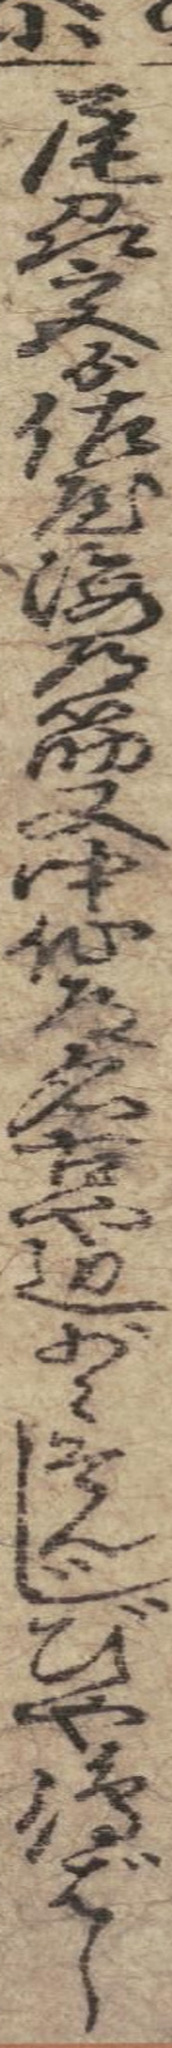尾州宮分佐屋海道筋又中仙道名古や辺少〻そんじびや伝ばし
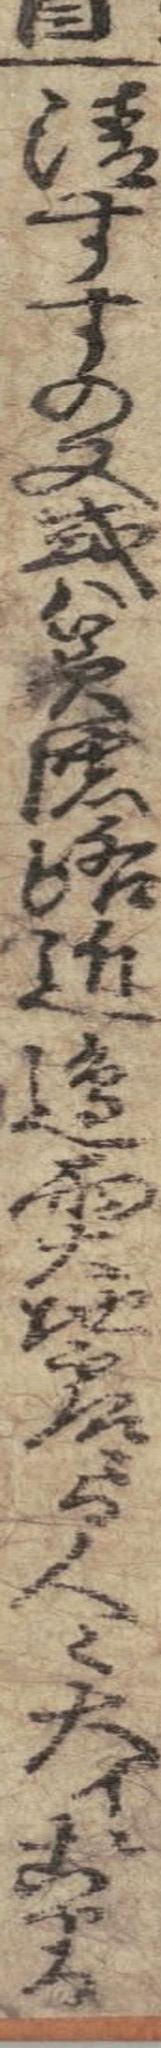清すすの又或は美農露近辺雨火地震にて人〻大いにこまる
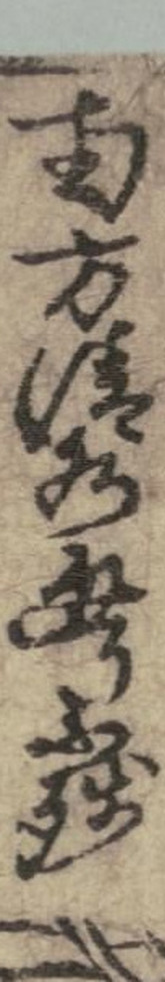南方清水通り不残
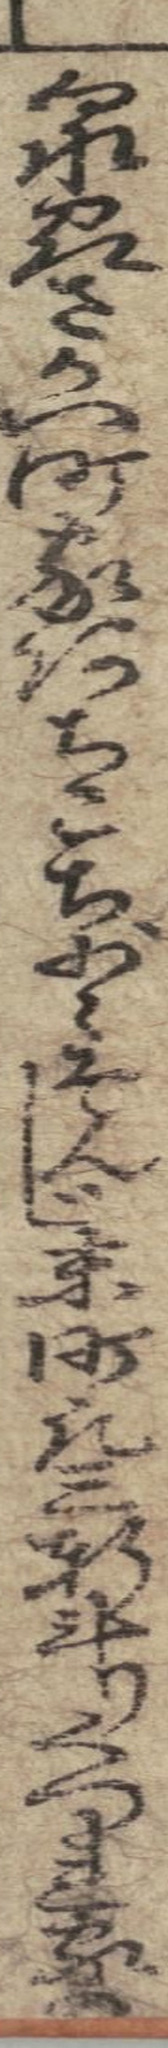泉州さかい町家あちこち少〻そんじ東町凡三軒計りくつれ家の
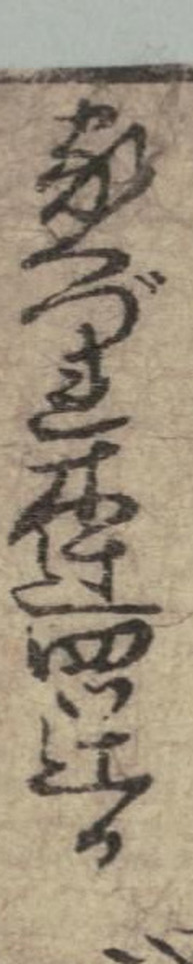家くづれ木辻四ツ辻ゟ
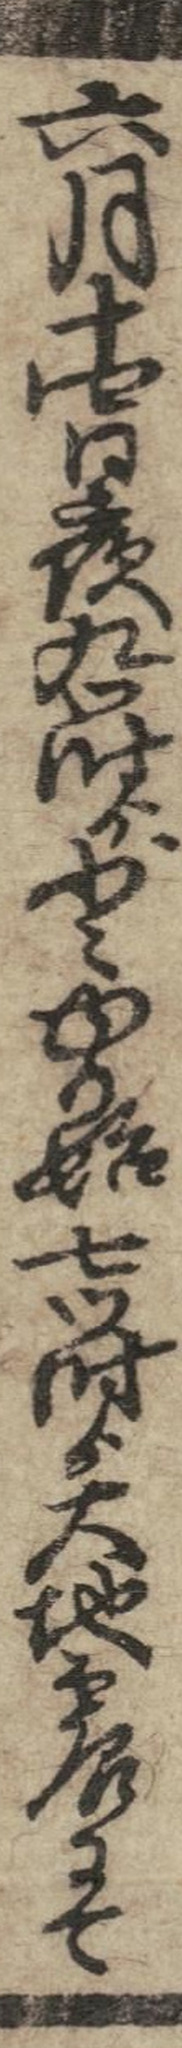六月十四日夜九ツ時ゟ少々ゆる始め七ツ時ゟ大地震にて
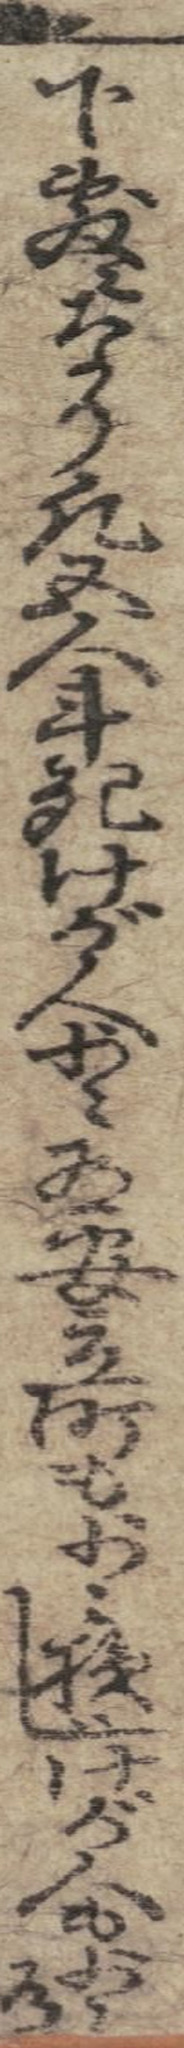下敷になり凡五人計死けが人少〻有安立町も少〻損じけが人も少〻有
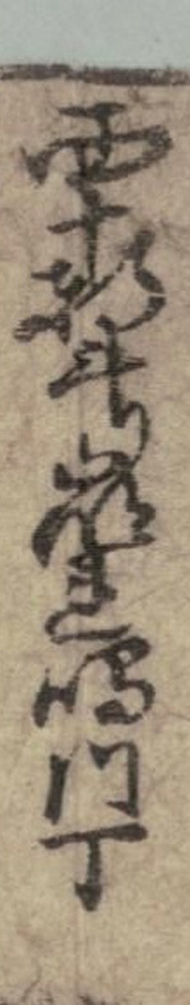西十軒計り崩れ鳴川丁
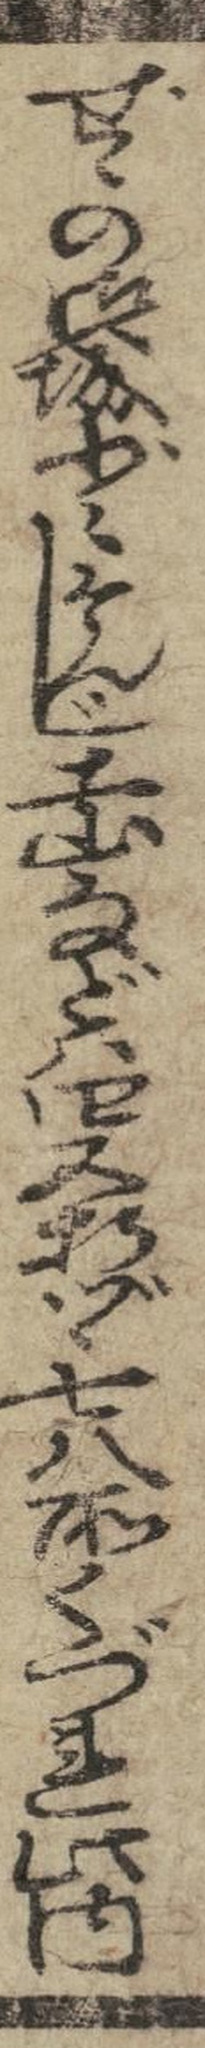ぜゞの御城少々そんじ土山などは四五軒ツゝ七八ケ所くつれ
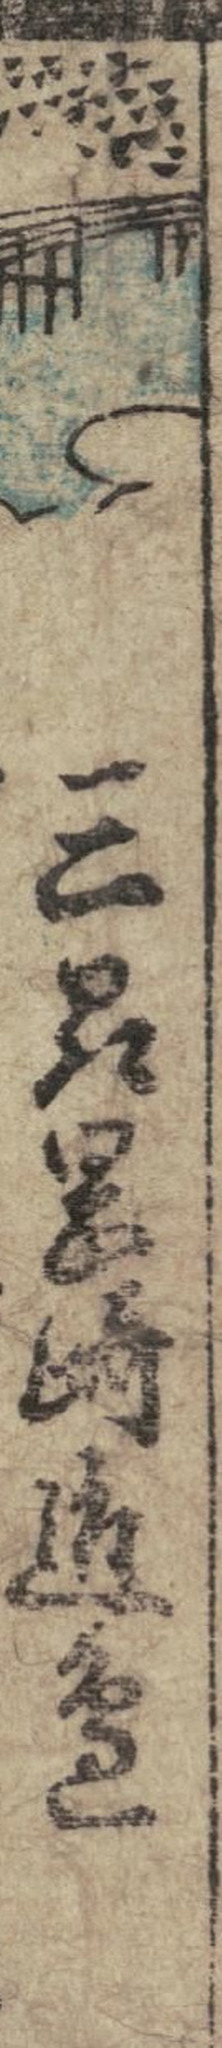三州岡崎近辺
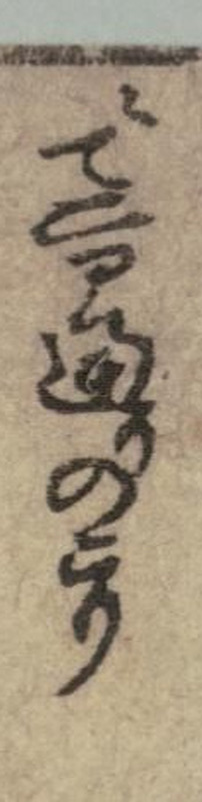にて二部通りのこり
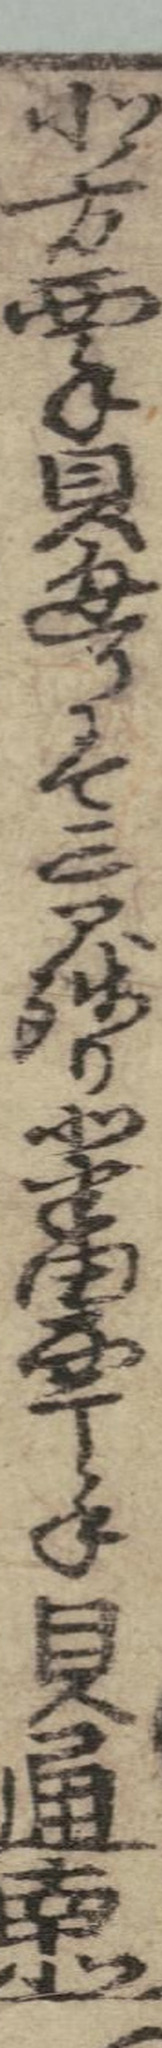北方西手貝通りにて三部残り北半田西丁手貝通り南北
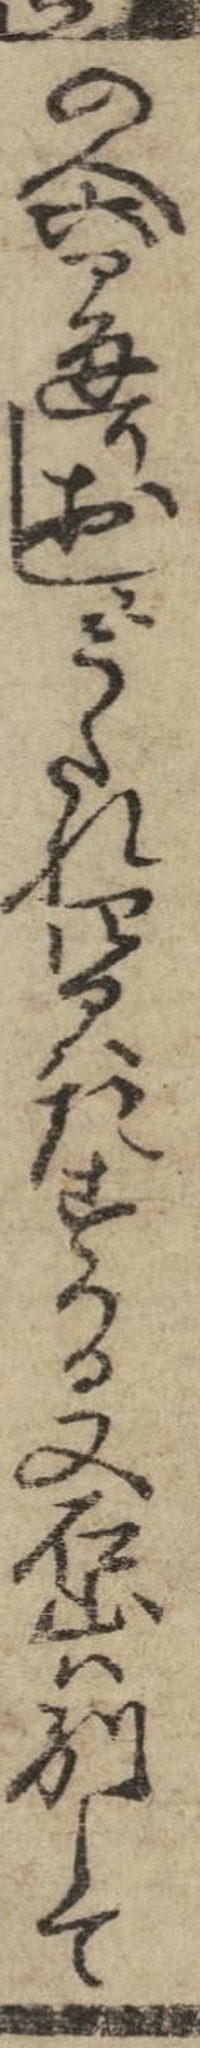の人六部通りおしたをされ四部はたすかる又石山は別して
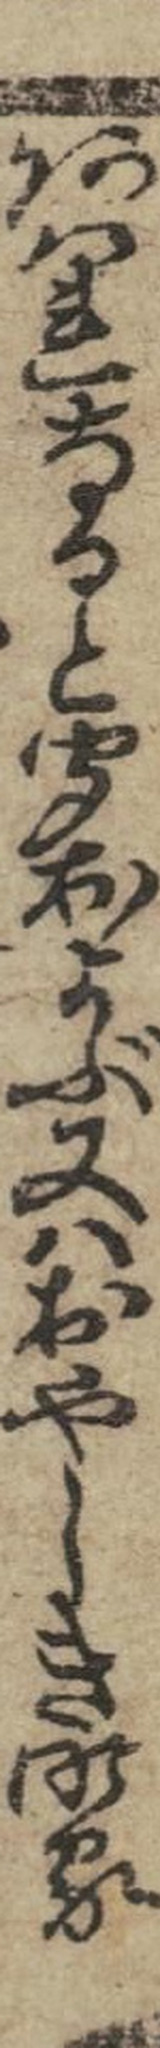あはれなると聞およぶ又はおやしき町家
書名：聞書　諸國大地震并ニ出火・早飛脚廻りにてくわしき所本しらべ　大地震・山城勢州大和三河江州越前　聞書　大地震並ニ出火の次第
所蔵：東京大学地震研究所図書室 Earthquake Research Institute Library, The University of Tokyo, JAPAN
